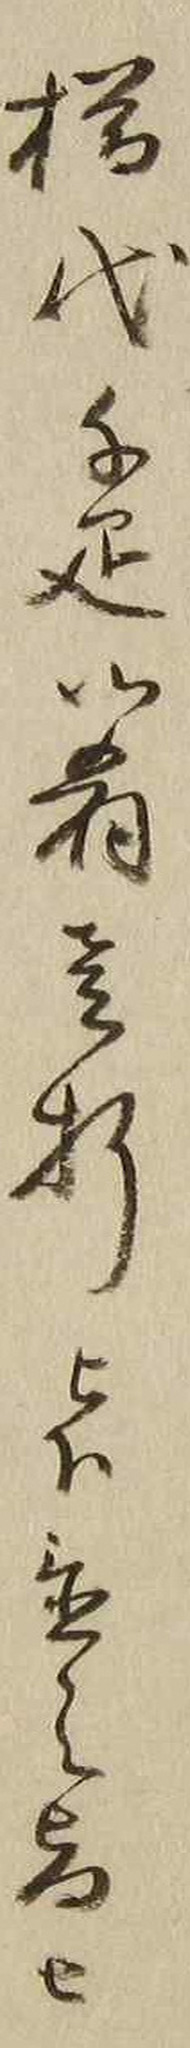樽代千疋御肴壱折被下置候旨被
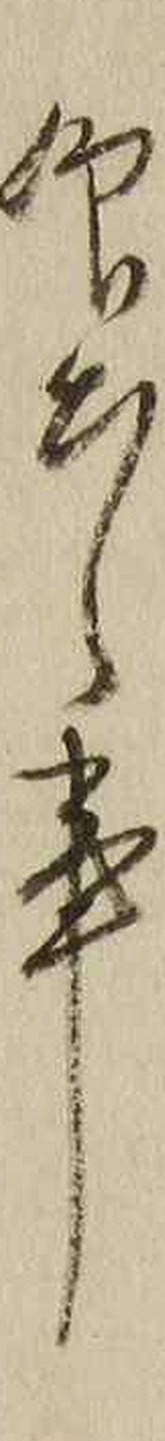仰出候事
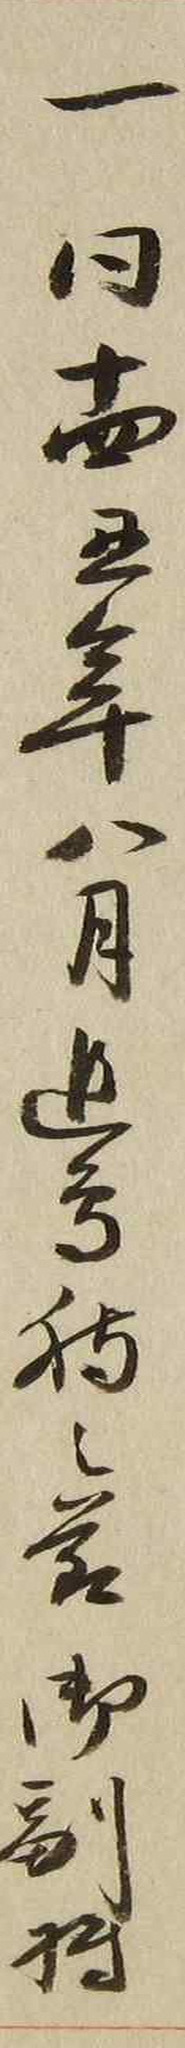一同十四丑年八月追鳥狩之節御副将
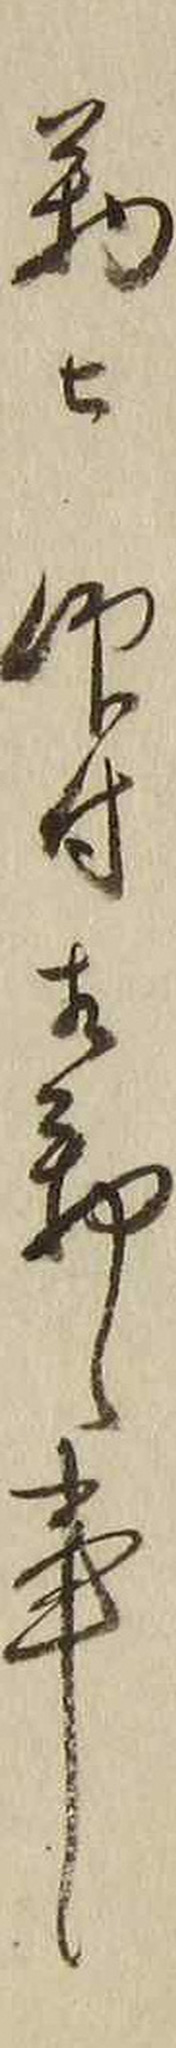勤被仰付相勤候事
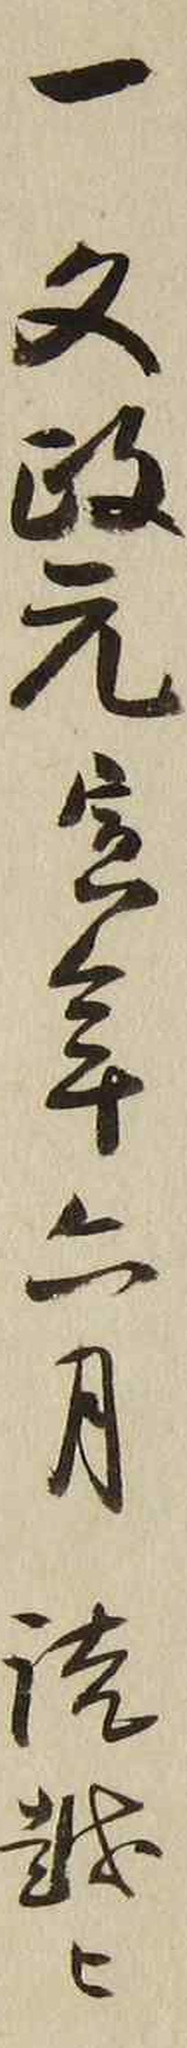一文政元寅年六月詰越被仰
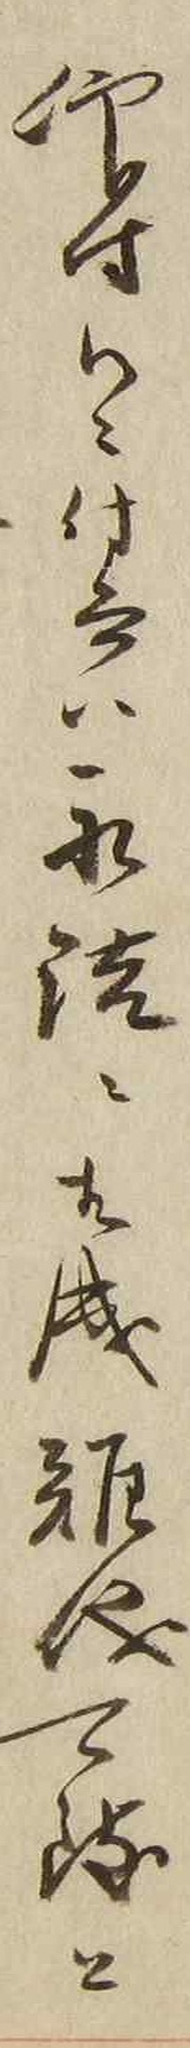仰付候に付而は永詰に相成難儀可致と
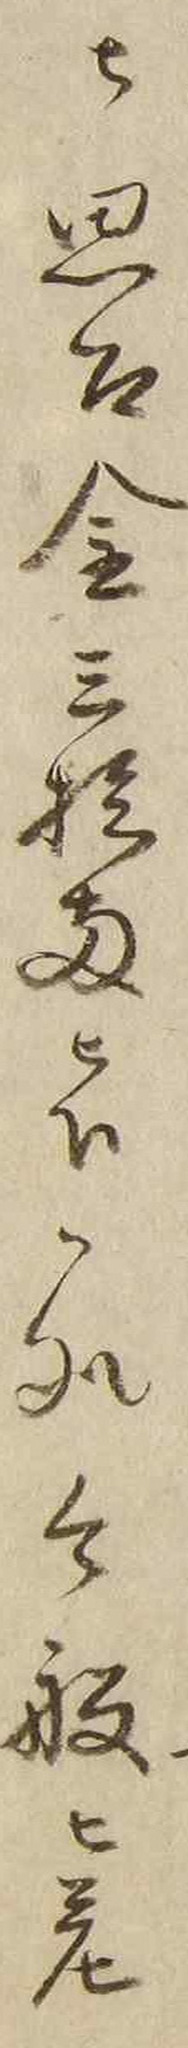被思召金三拾両被下候処今般被差

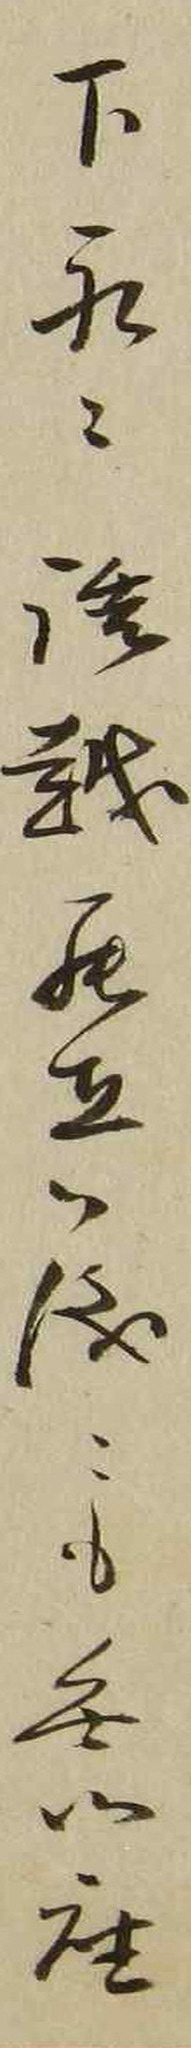下永々詰越罷在候儀にも無御座
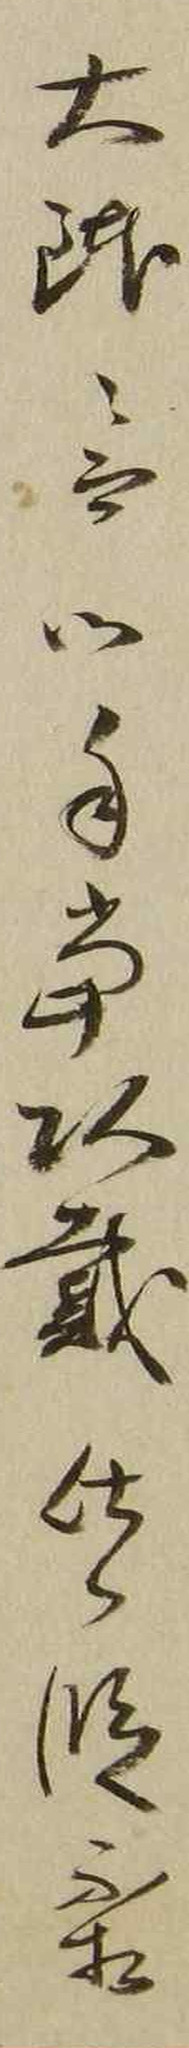大隮に而御手当頂戴仕候段不相
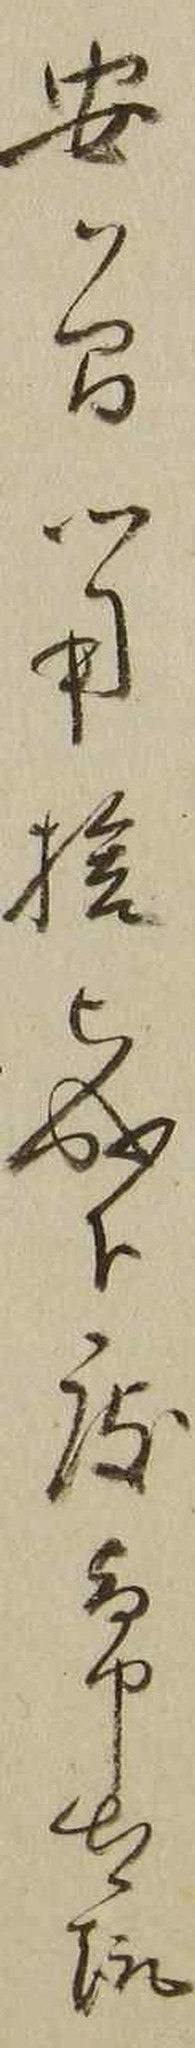安候間御用捨被成下度旨申出候趣
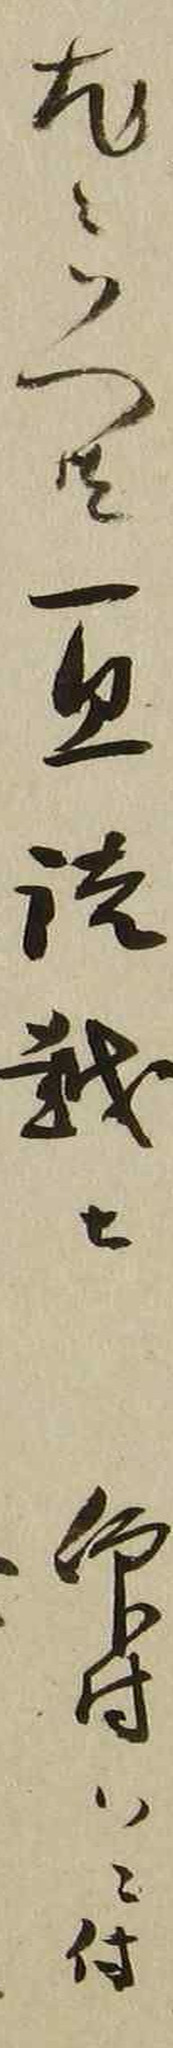尤に候へ共一旦詰越被仰付候に付
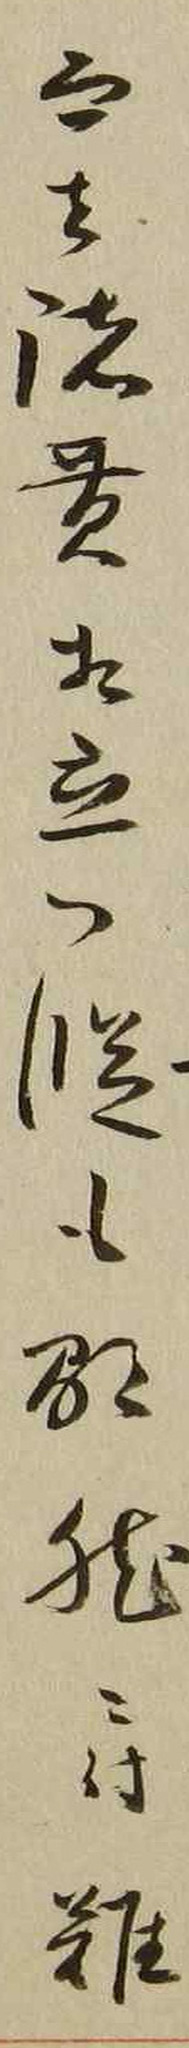而は諸費相立候段も顕然に付難
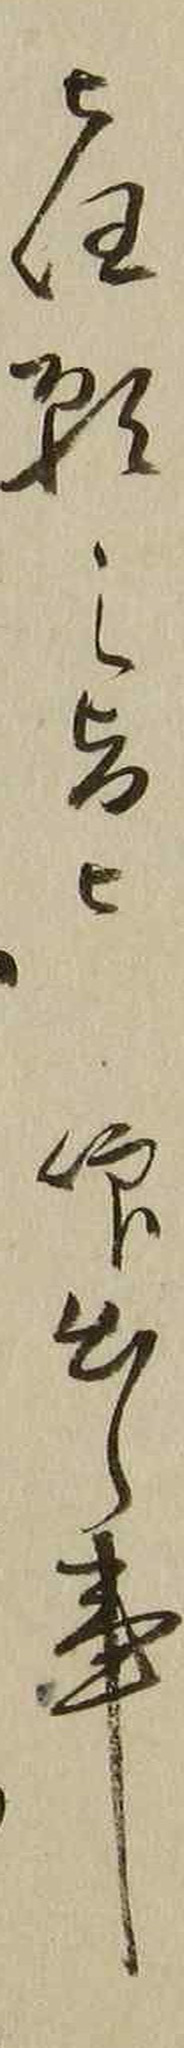被任願之旨被仰出候事
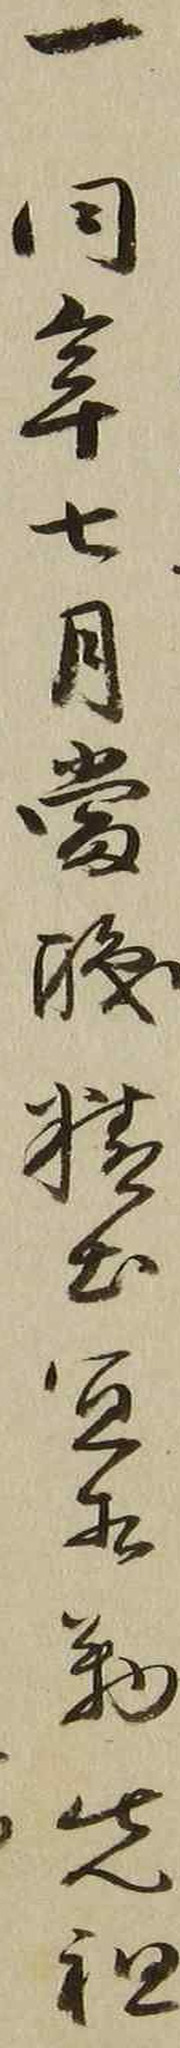一同年七月当職精出宜相勤先祖
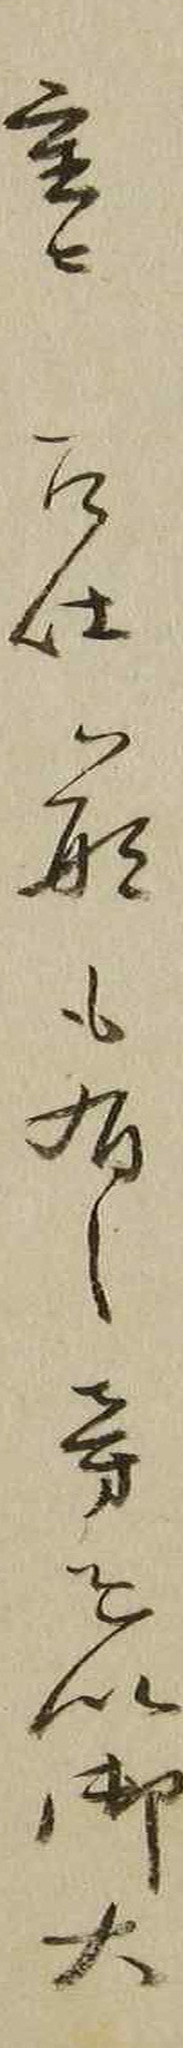重被召仕御形も有之旁を以御大
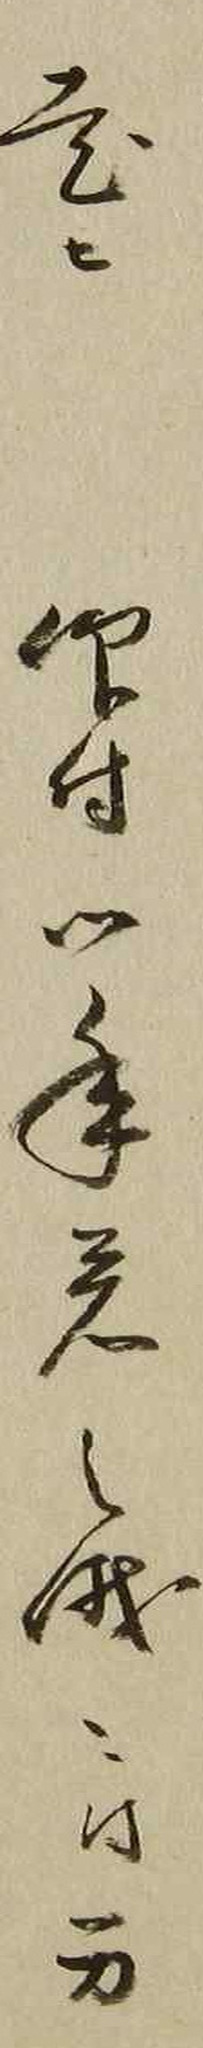老被仰付御手充之儀に付万
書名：諸士系譜　巻之269　さ之部1
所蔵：会津若松市立会津図書館
